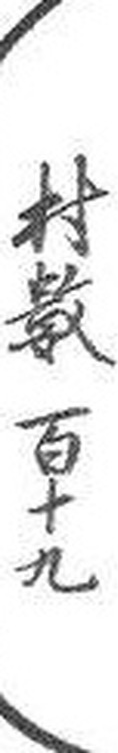村数六十二
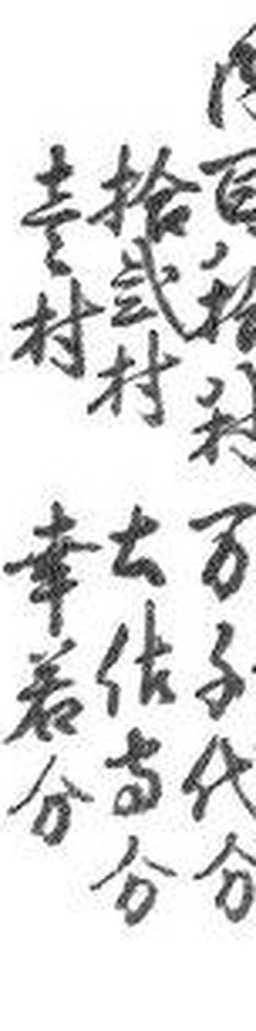壱村幸若分
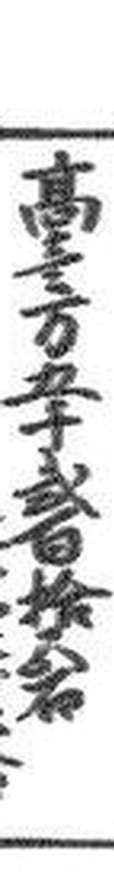高壱万五千弐百拾五石
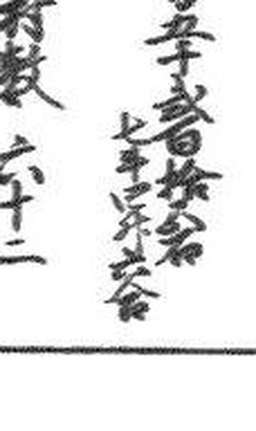五斗四升七合
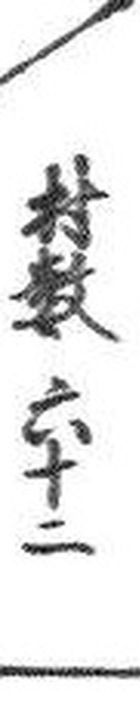村数六十二
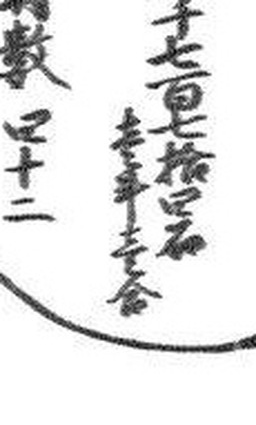壱斗壱合
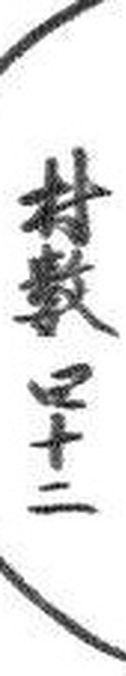村数四十二
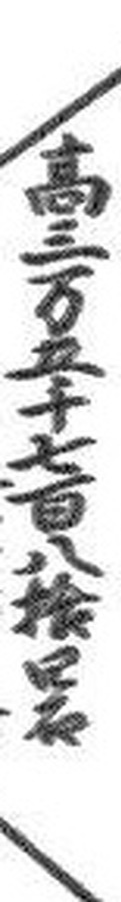高壱万五千弐百拾五石
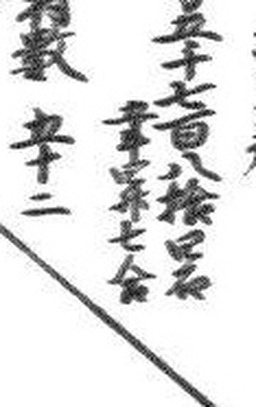五斗四升七合
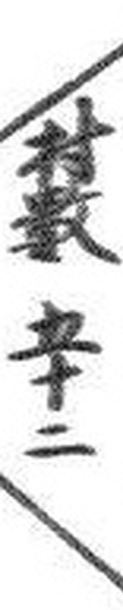村数五十二

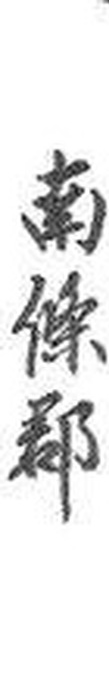南条郡
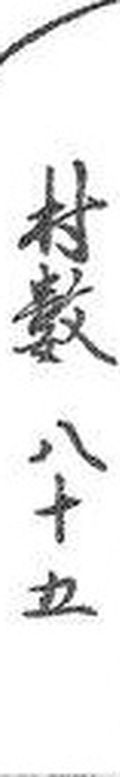村数八十五
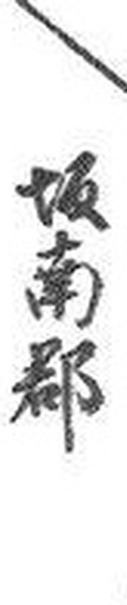坂南郡
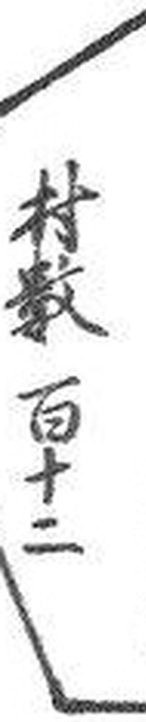村数百十二
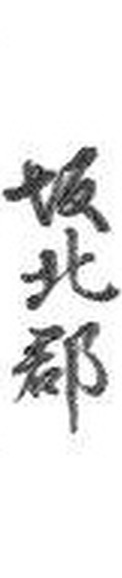坂南郡
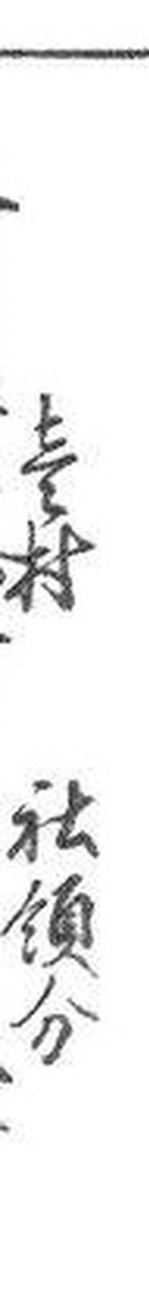坂北郡壱村社領分
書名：家譜 五 光通公 従寛永十三年到万治二年
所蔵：福井県文書館 Fukui Prefectural Archives
